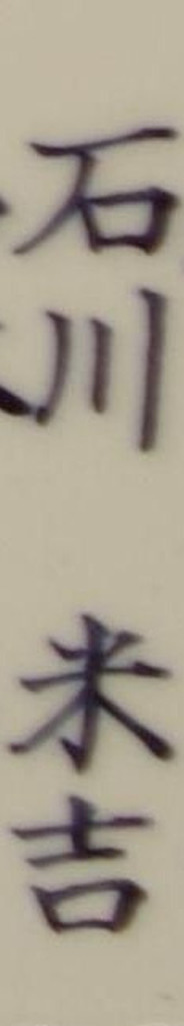石川米吉
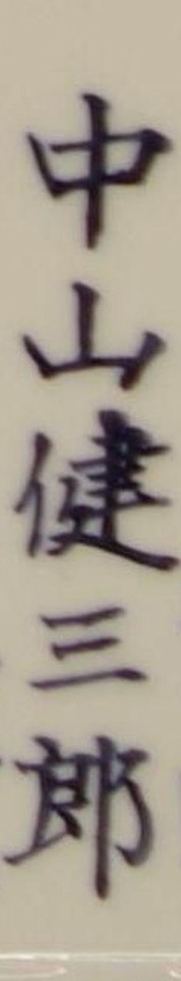中山健三郎
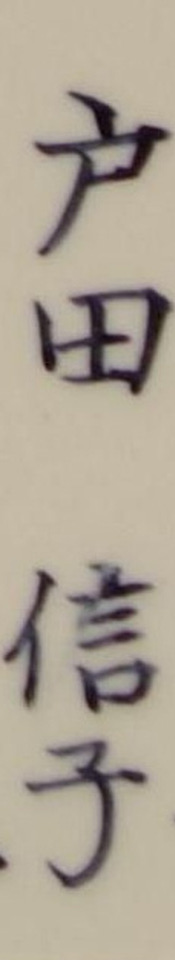戸田信子
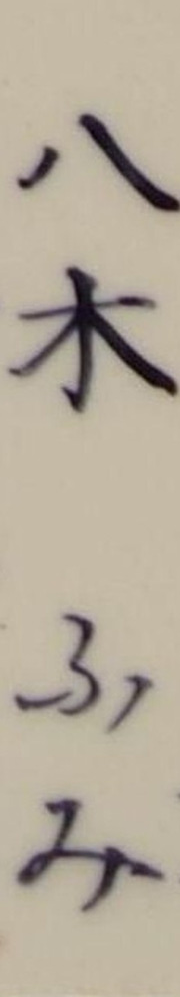八木ふみ
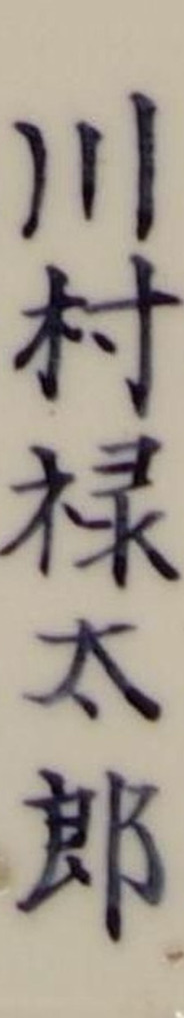川村禄太郎
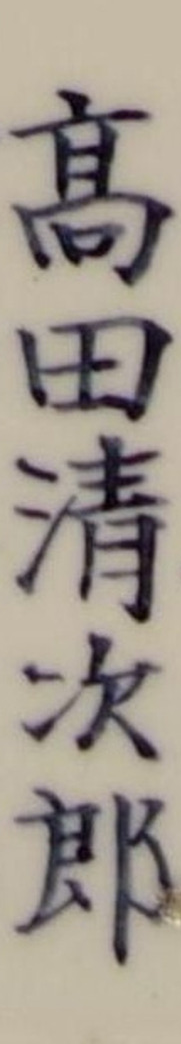高田清次郎
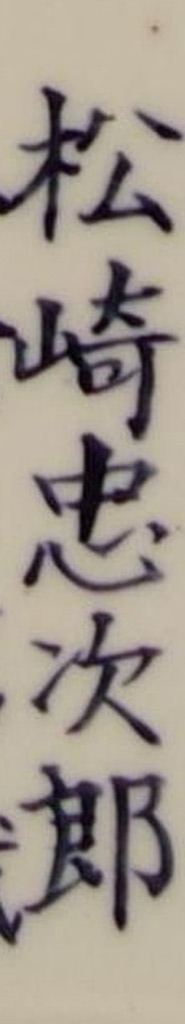松崎忠次郎
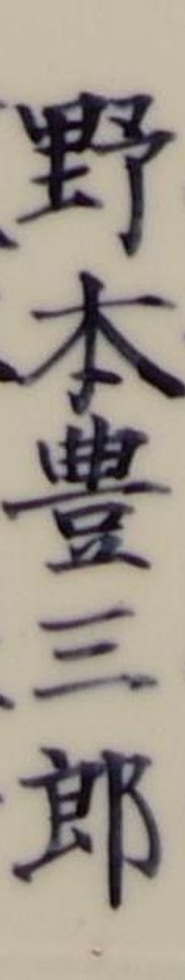野本豊三郎
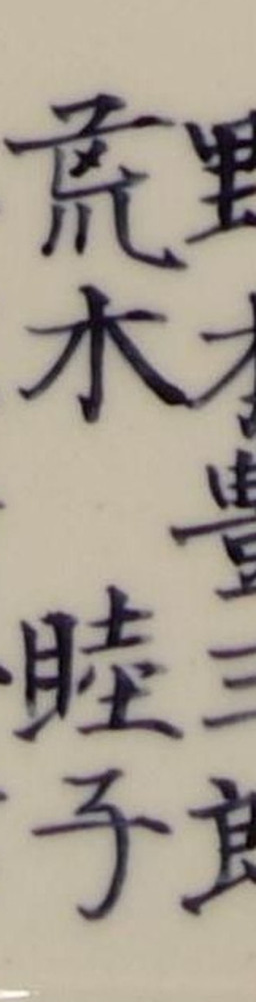荒木睦子
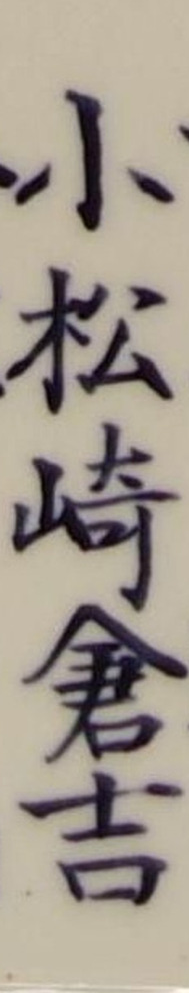小松崎倉吉
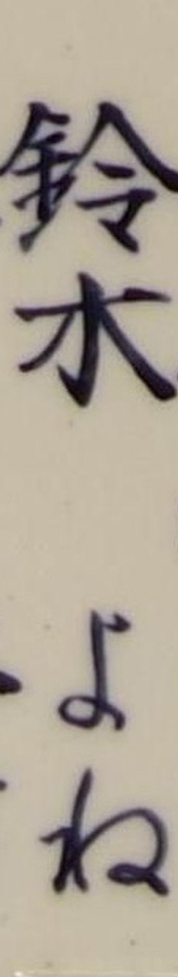鈴木よね
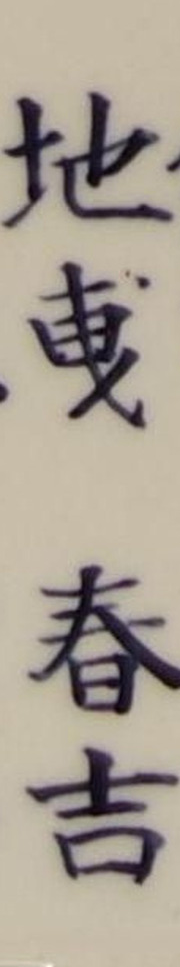地曳春吉
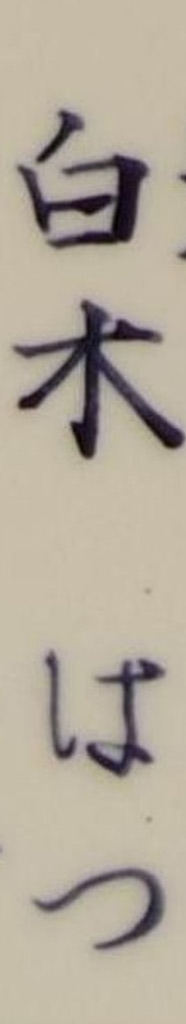白木はつ
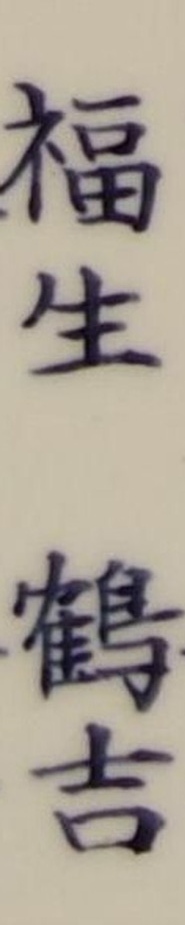福生鶴吉
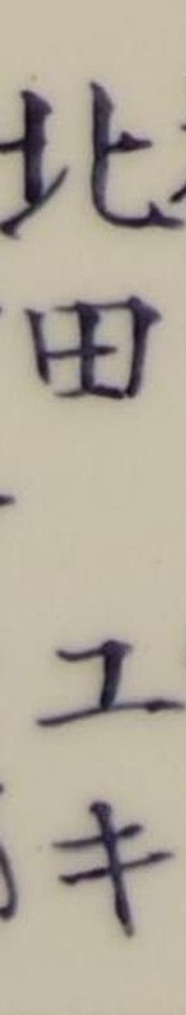北田ユキ
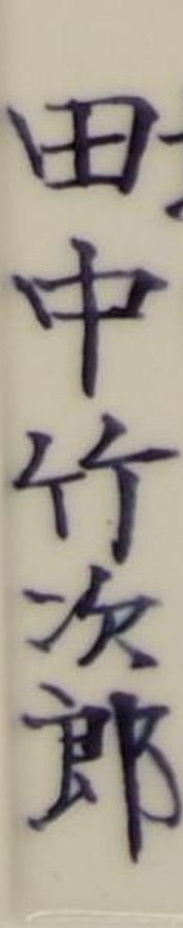田中竹次郎
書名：M~S
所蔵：高野山金剛峯寺
